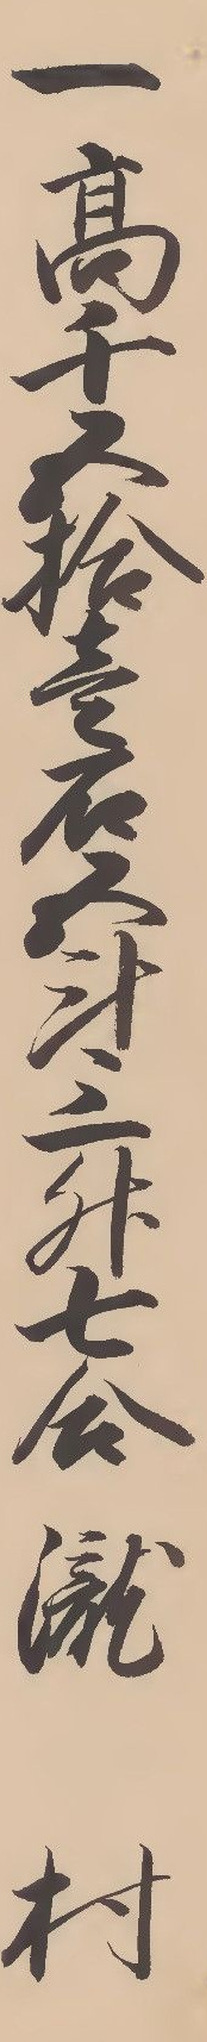一高千五拾壱石五斗三升七合滝村
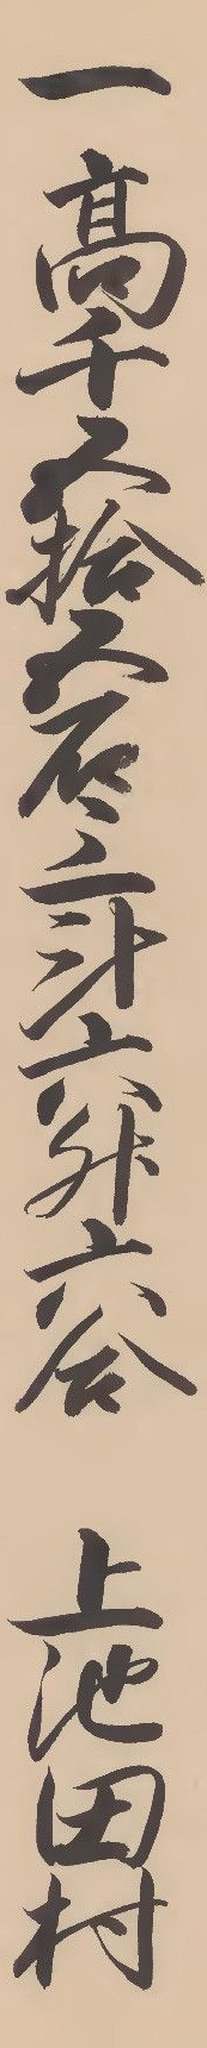一高千五拾五石三斗六升六合上池田村
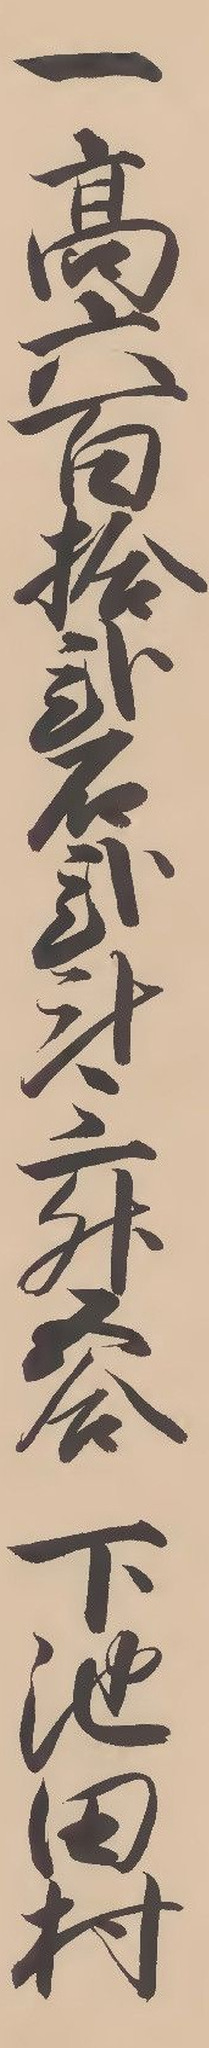一高六百拾弐石弐斗三升五合下池田村
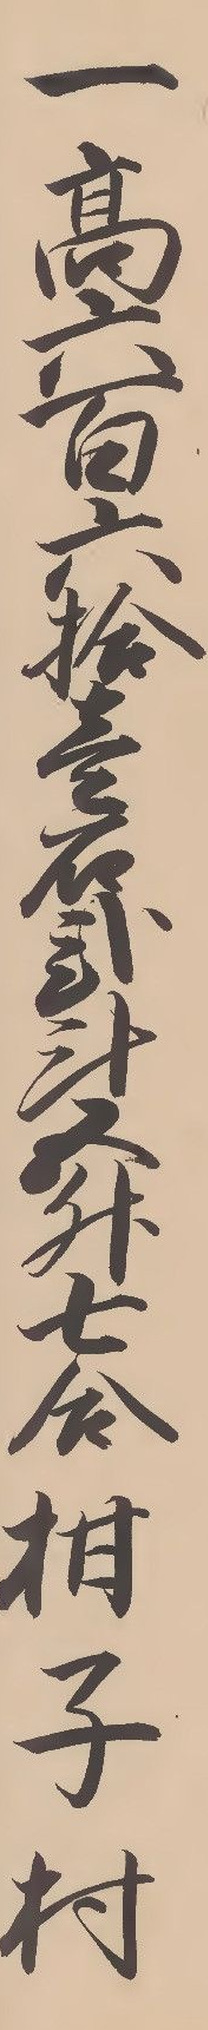一高六百六拾壱石弐斗五升七合柑子村
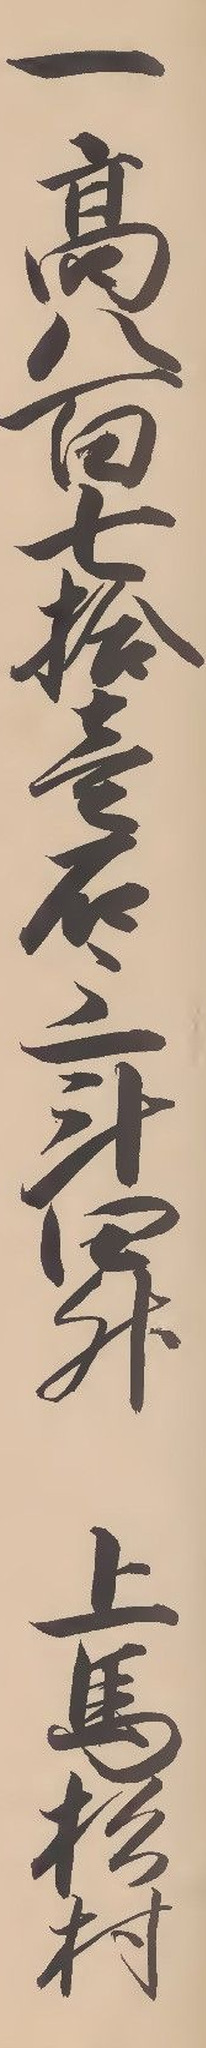一高八百七拾壱石三斗四升上馬杉村
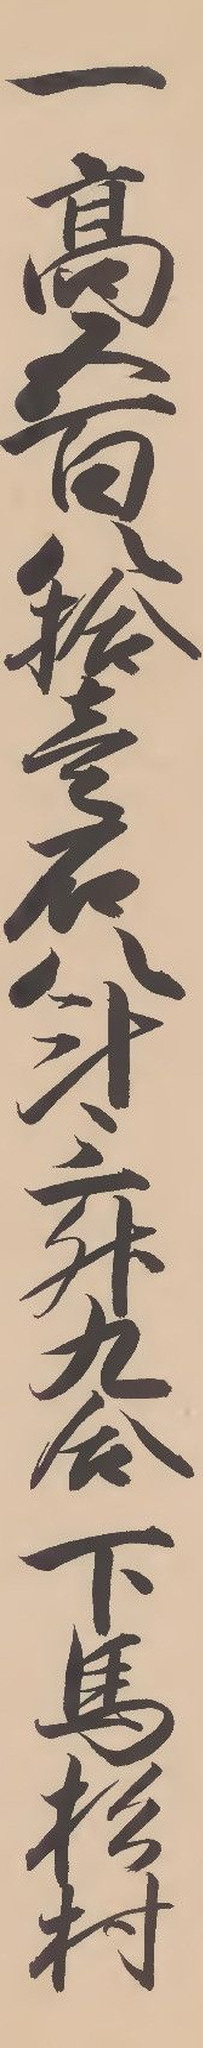一高五百八拾壱石八斗三升九合下馬杉村
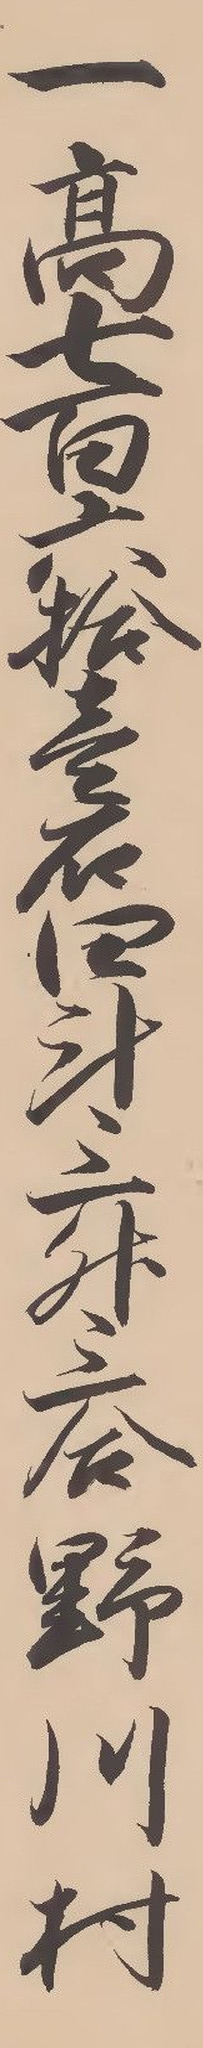一高七百六拾壱石四斗三升三合野川村
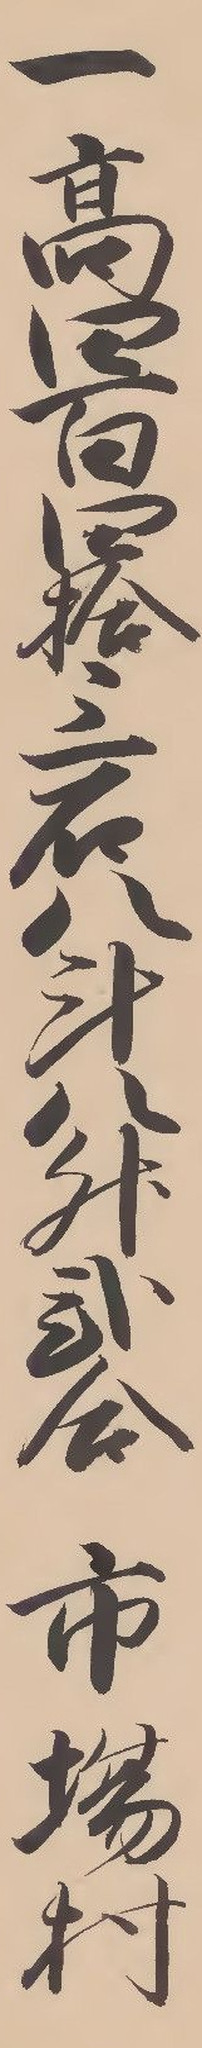一高四百四拾三石八斗八升弐合市場村

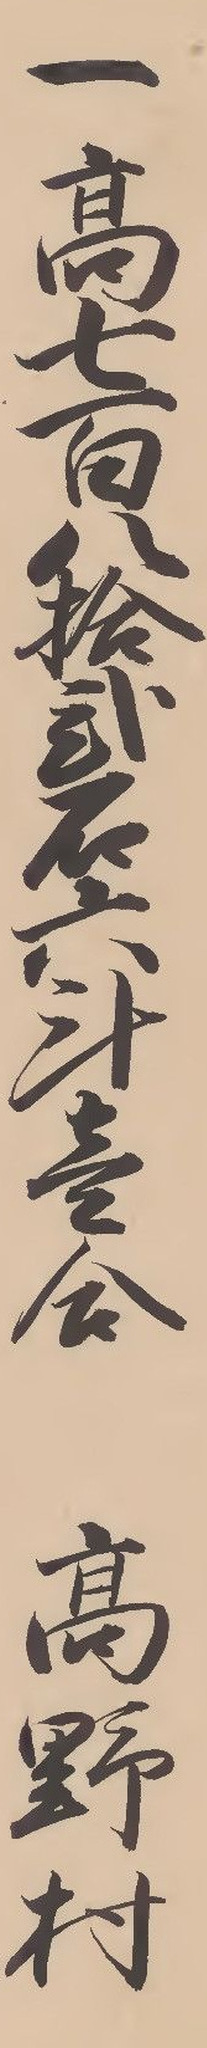一高七百八拾弐石六斗壱合高野村
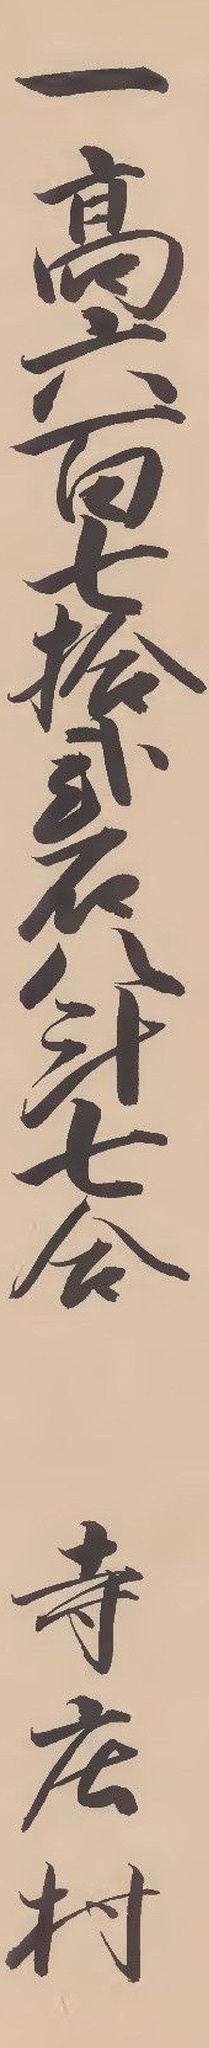一高六百七拾弐石八斗七合寺庄村
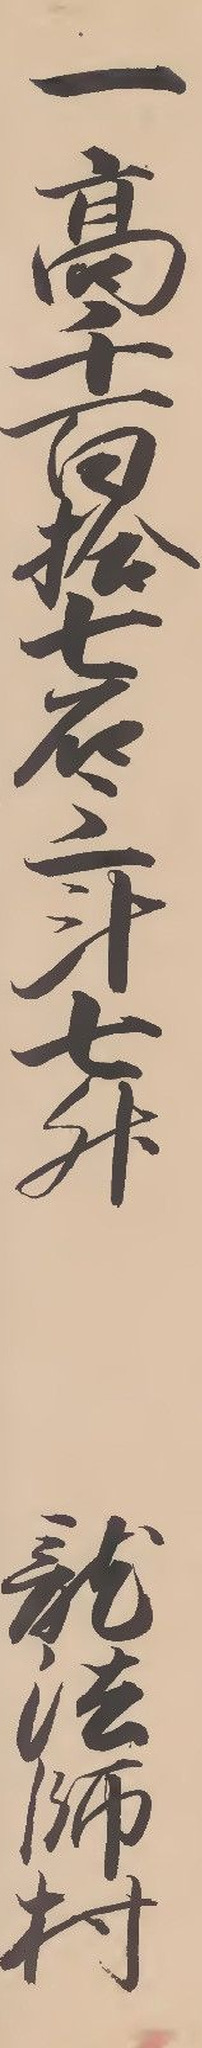一高千百拾七石三斗七升竜法師村
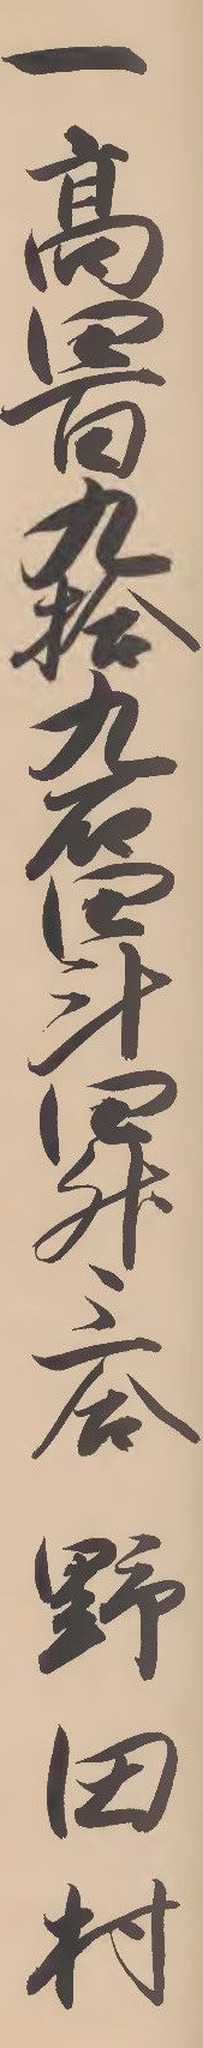一高四百九拾九石四斗四升三合野田村
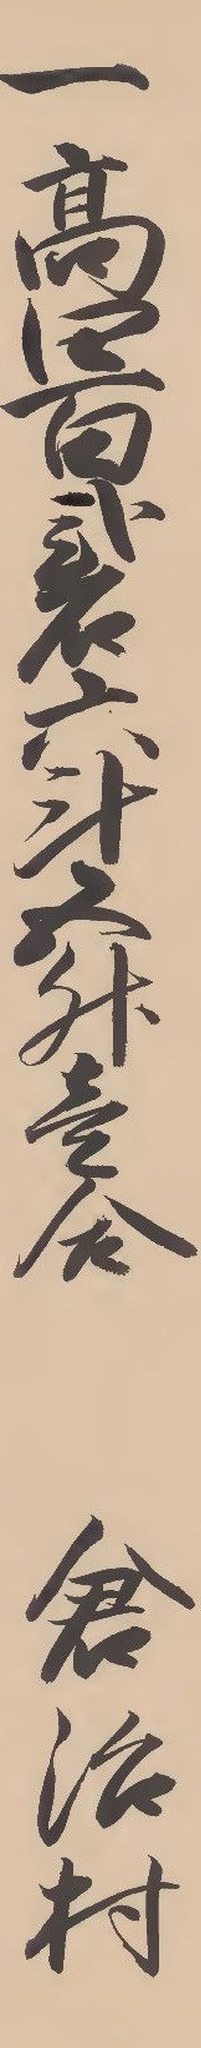一高四百弐石六斗五升壱合倉治村
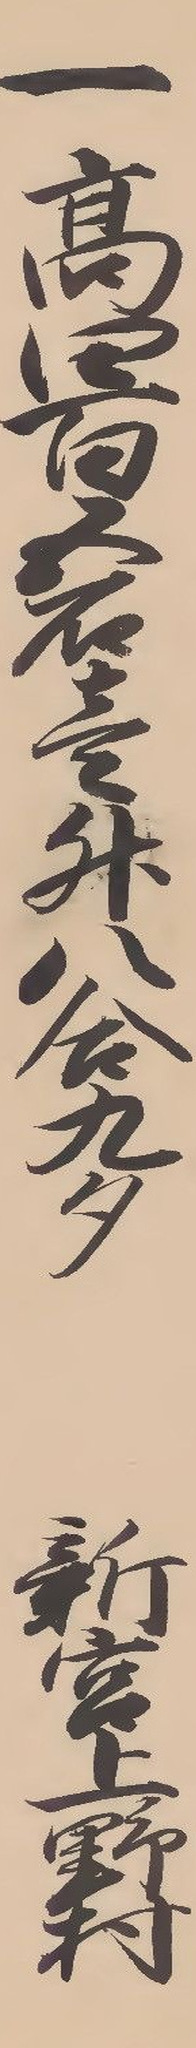一高四百五石壱升八合九勺新宮上野
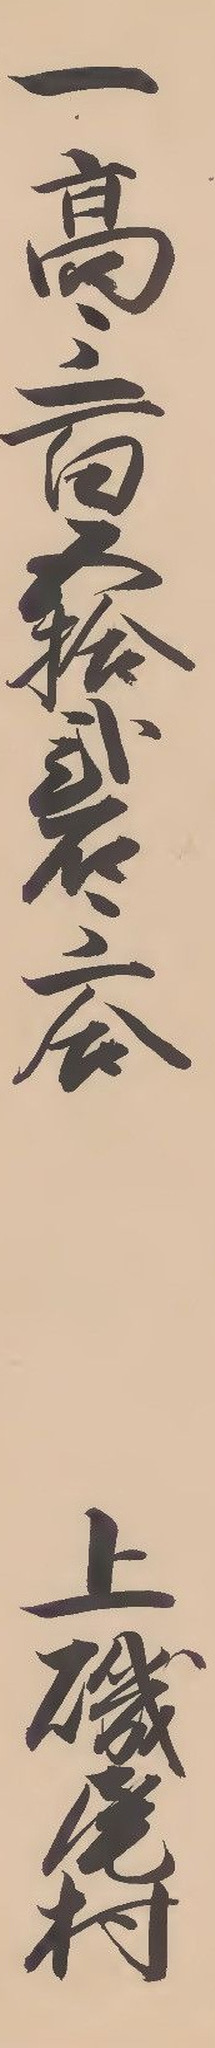一高三百五拾弐石三合上磯尾村

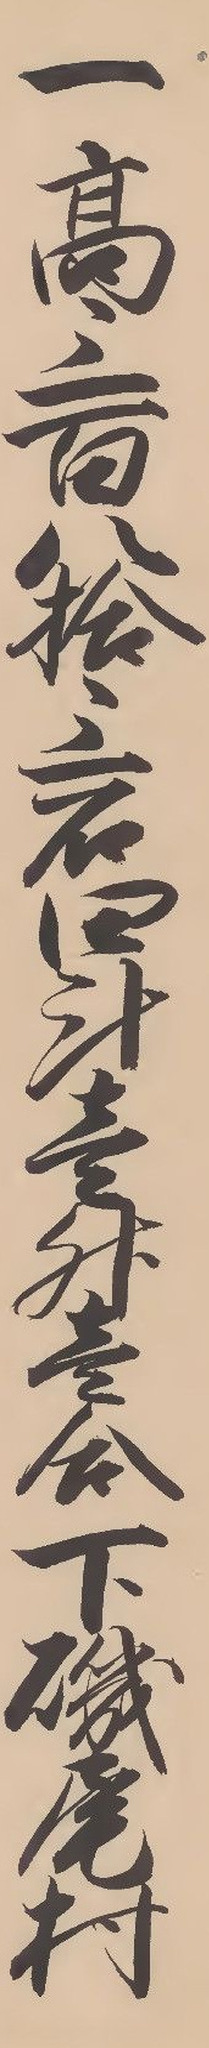一高三百八拾三石四斗壱升壱合下磯尾村
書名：近江国郷帳
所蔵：国立公文書館 National Archives of Japan
